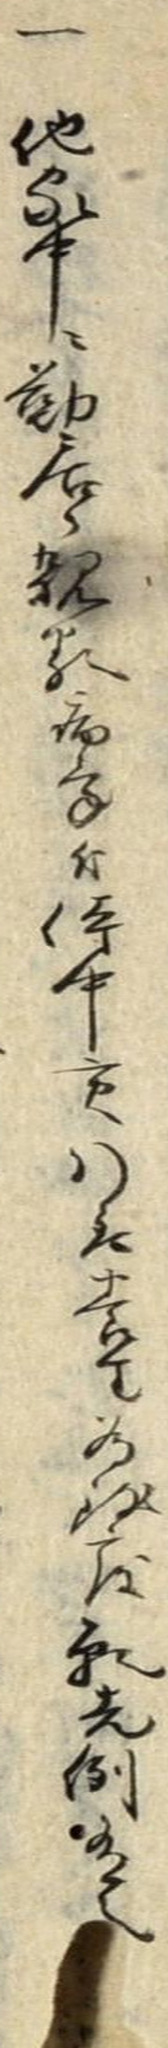一他家中に勤居候親類病気付侍中方へ引取養生為致度願先例有之
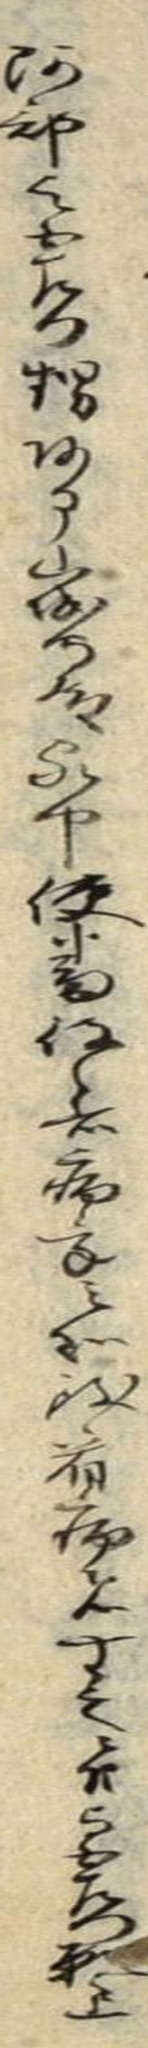阿部与五左衛門甥阿部山城守殿へ家中使番役之者病気之処致看病者無之に付与五左衛門願之上
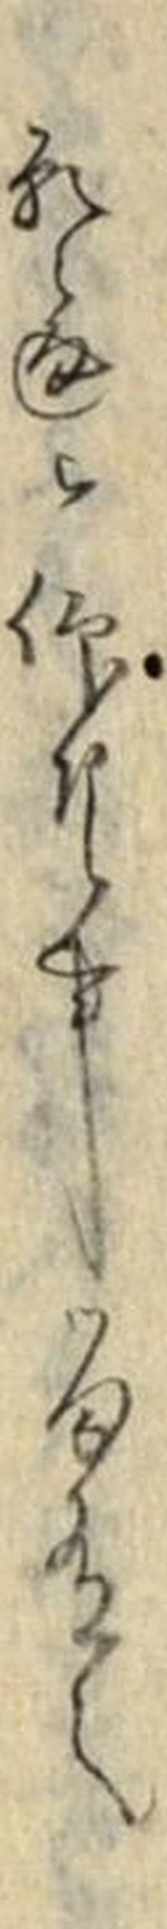願之通被仰付候事留有之

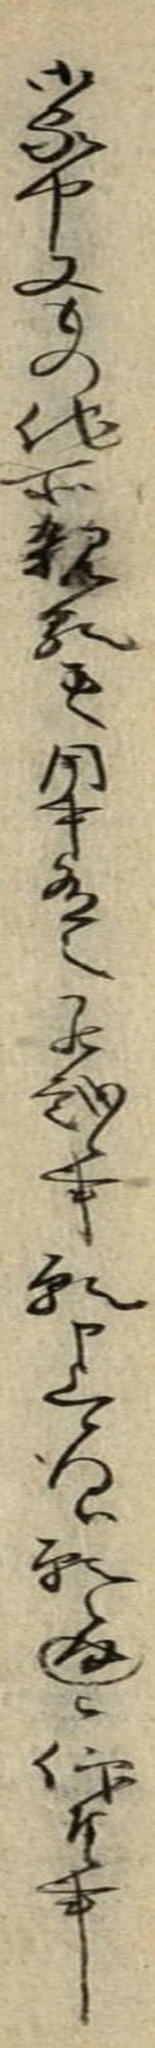一御家中又もの他所親類方へ用事有之罷越候事願申上候得は願之通被仰付候事
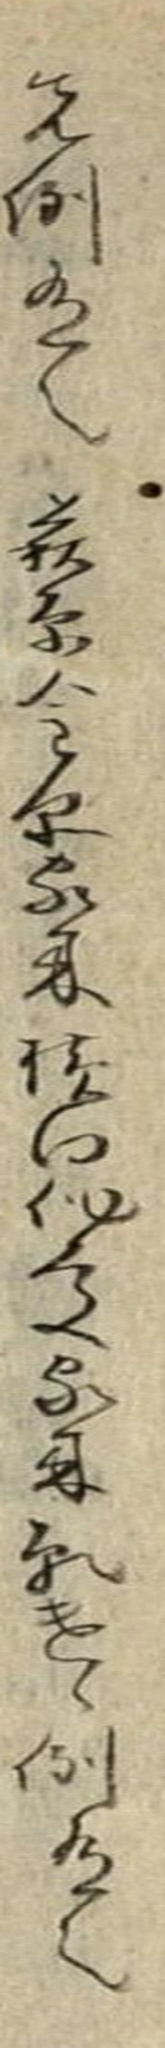先例有之萩原金兵衛家来横田作太夫家来願遣候例有之
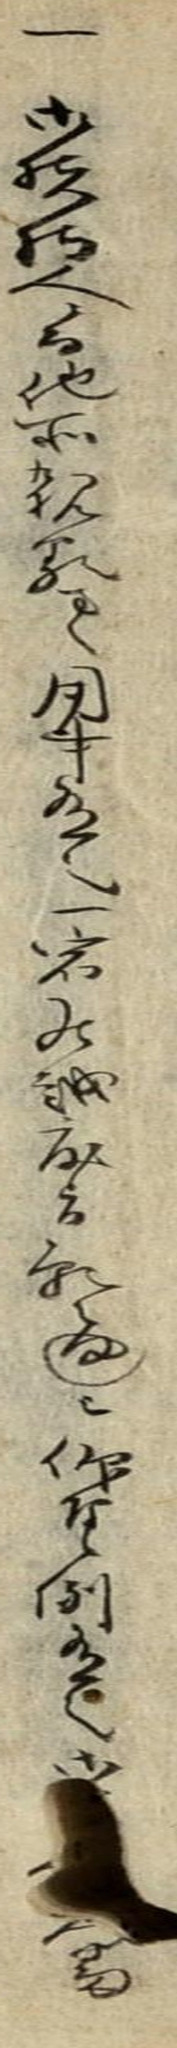一御扶持人にて他所親類方へ用事有之一宿罷越度旨願之通被仰付候例有之御番
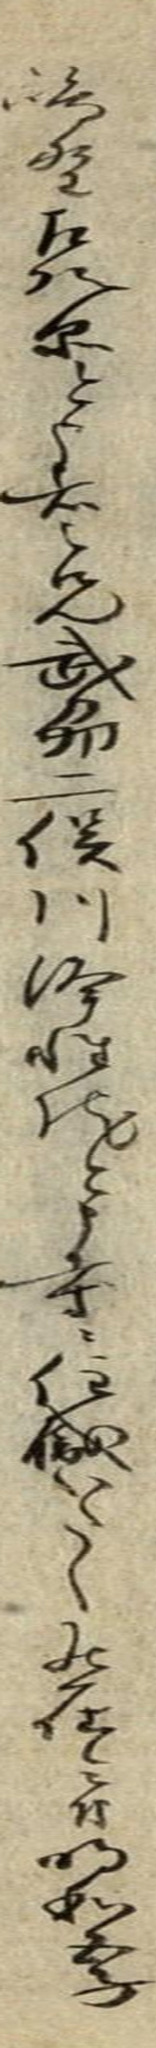嶋野佐次兵衛と申者之兄武州二俣川浄性院と申寺に住職いたし罷在候に付明和五子
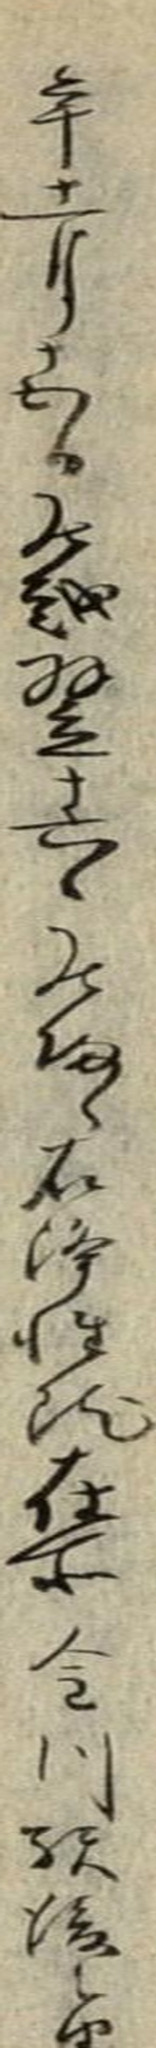年十一月十五日罷越翌十六日罷帰候右浄性院在所金川駅後之由
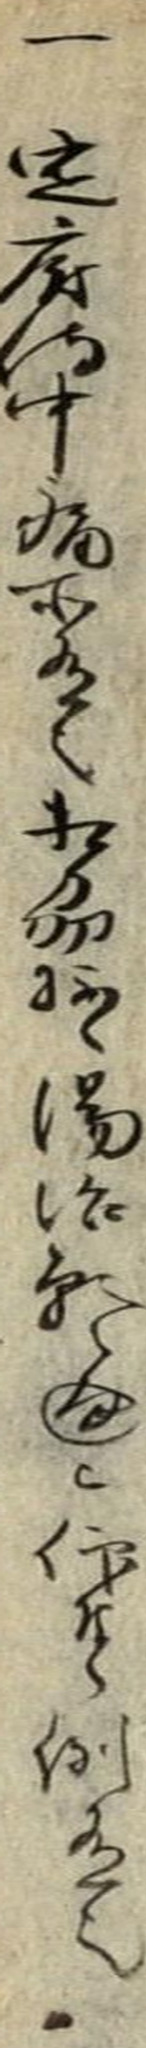一定府侍中痛所有之相州抔へ湯治願之通被仰付候例有之
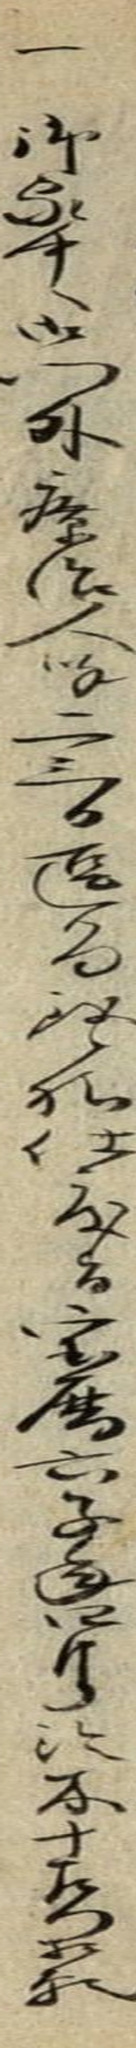一御家中へ御門外療治人呼二三日逗留致候様仕度旨宝暦六子年四月鈴木十左衛門相願
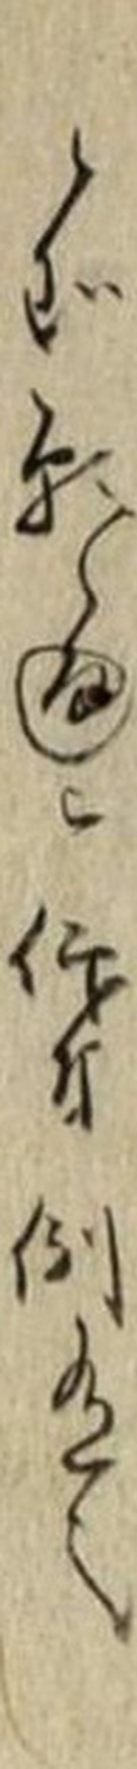候処願之通被仰付例有之
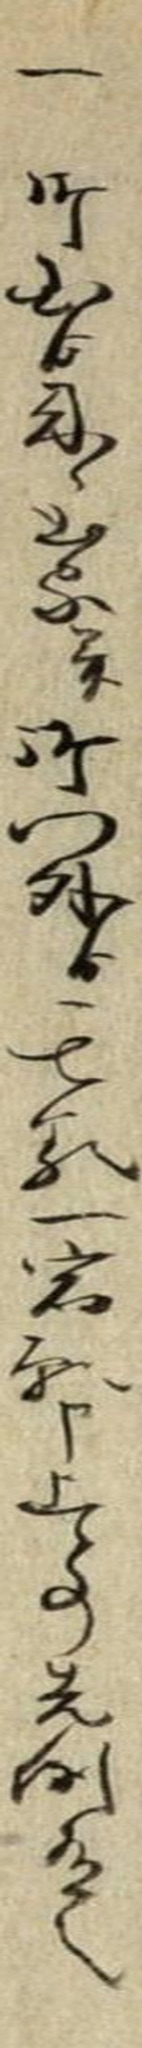一御国ゟ来候出家并御門外ゟ其類一宿願申上候事先例有之
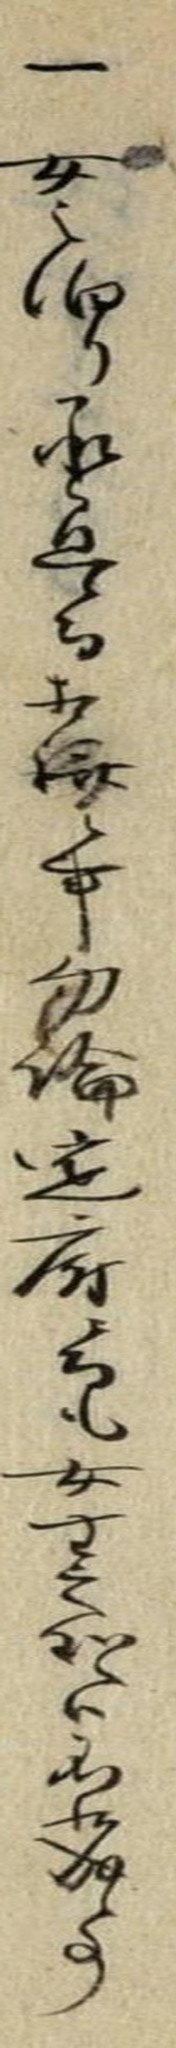一女之泊り承置候て相済候事勿論定府にても女無之処へは不相成候事
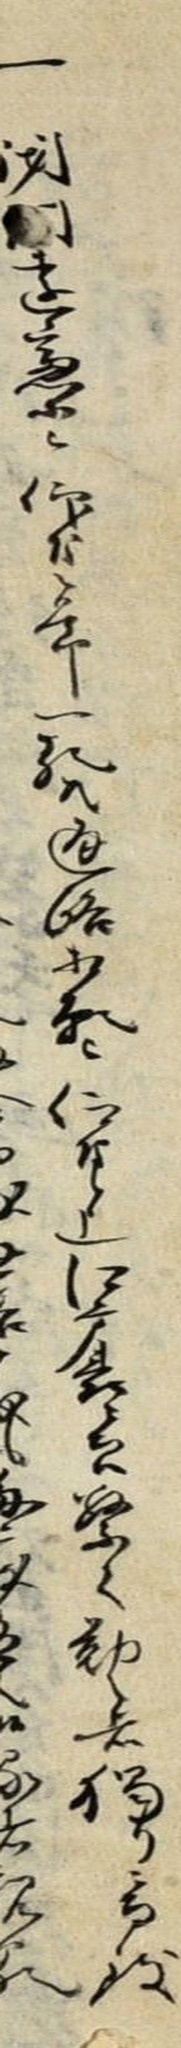一閉門遠慮等被仰付候節一類共通路相願被仰付候上江戸表にては繁々勤之者独りにて致
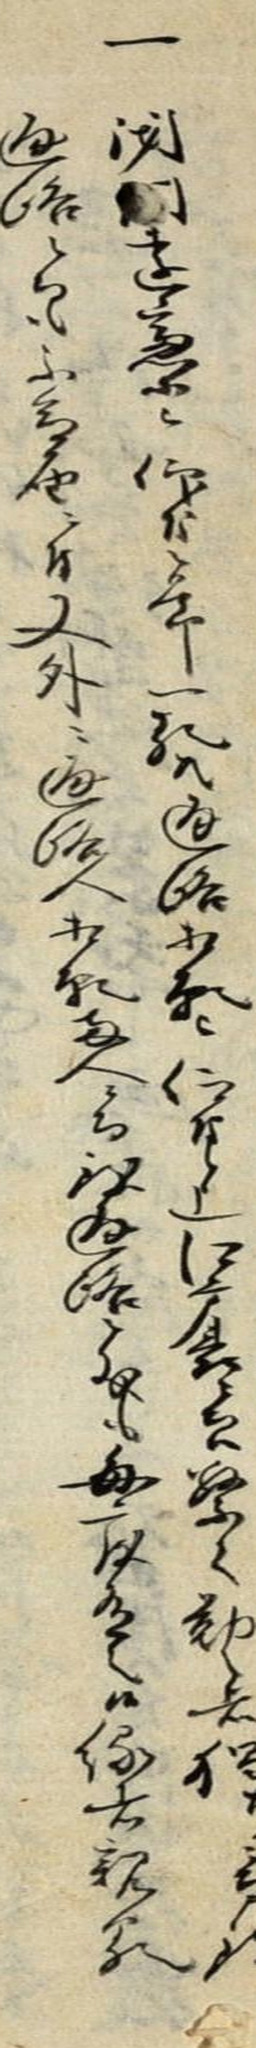通路候ても不参届に付又外に通路人相願両人にて致通路候義も毎度有之候縁者親類
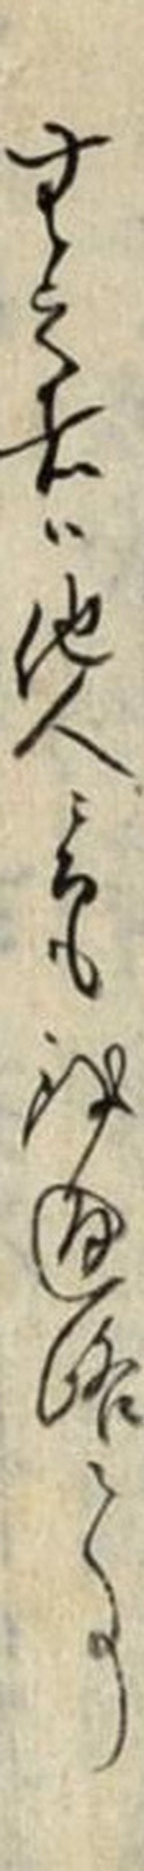無之者は他人にても致通路候事
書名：三都并道中之部
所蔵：福井県文書館 Fukui Prefectural Archives
